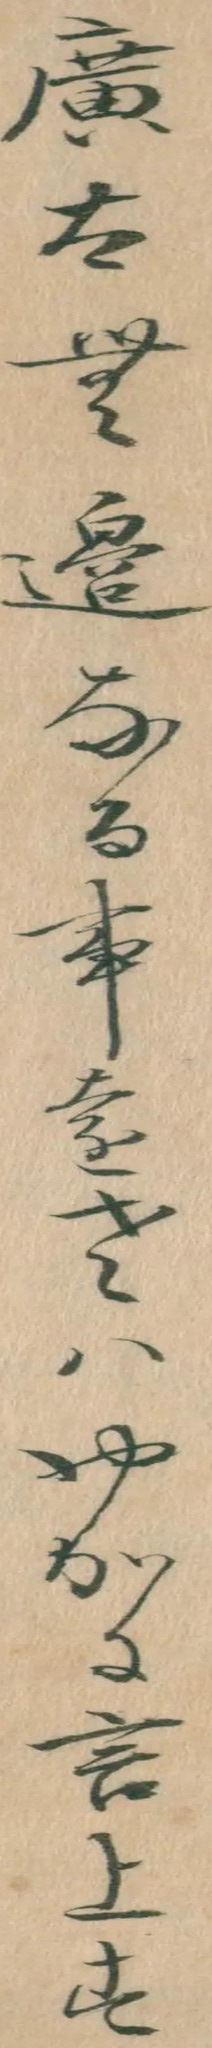廣太無邊なる事をさはやかに言上す
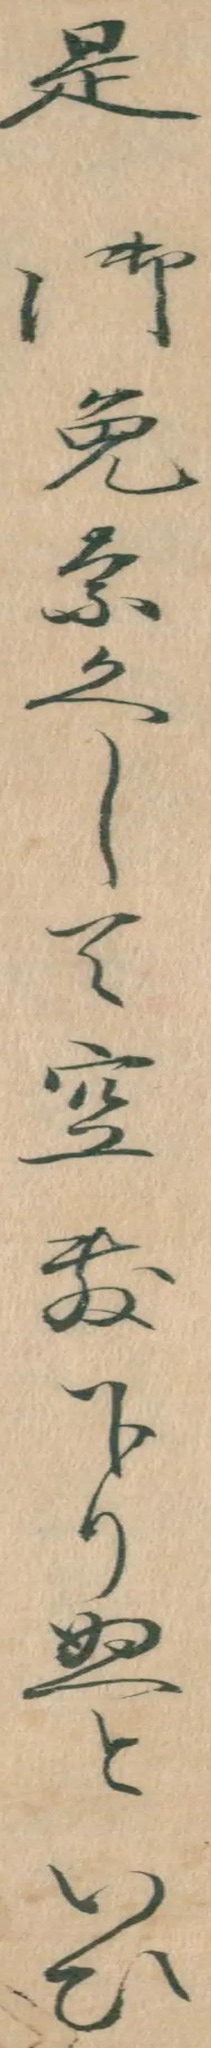是御免なくして空敷下りぬといひ
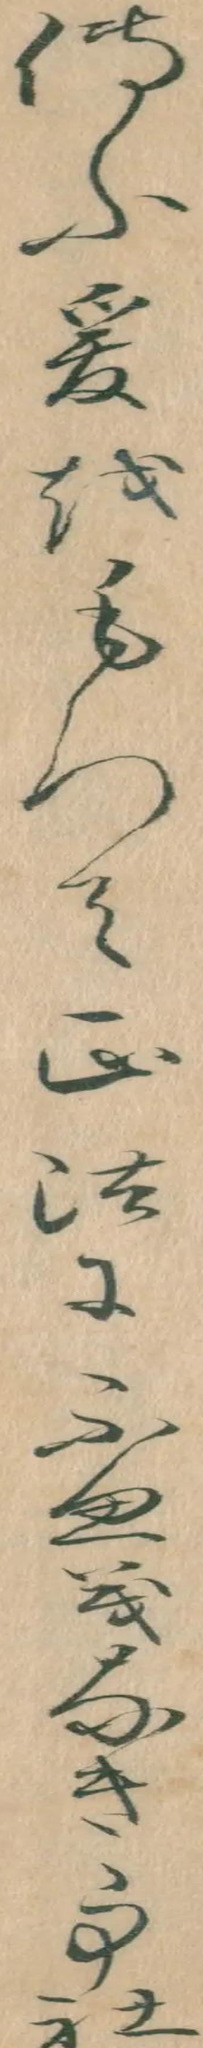傳ふ爰をもつて正法にふしきなき事社
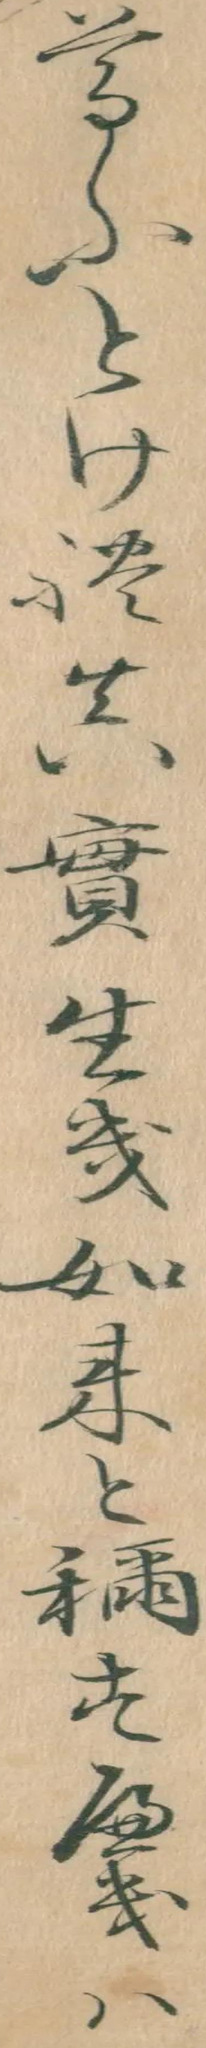尊ふとけれ眞實生き如来と穪すへきは
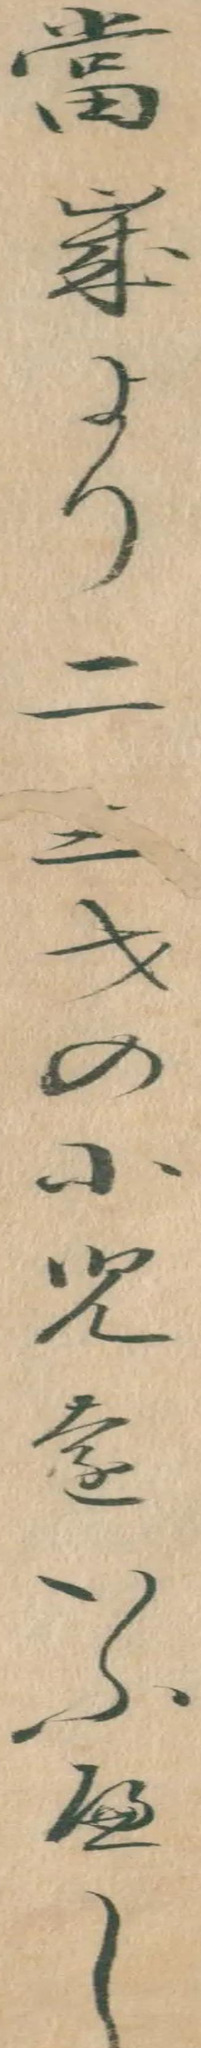當歳より二三才の小児をいふへし
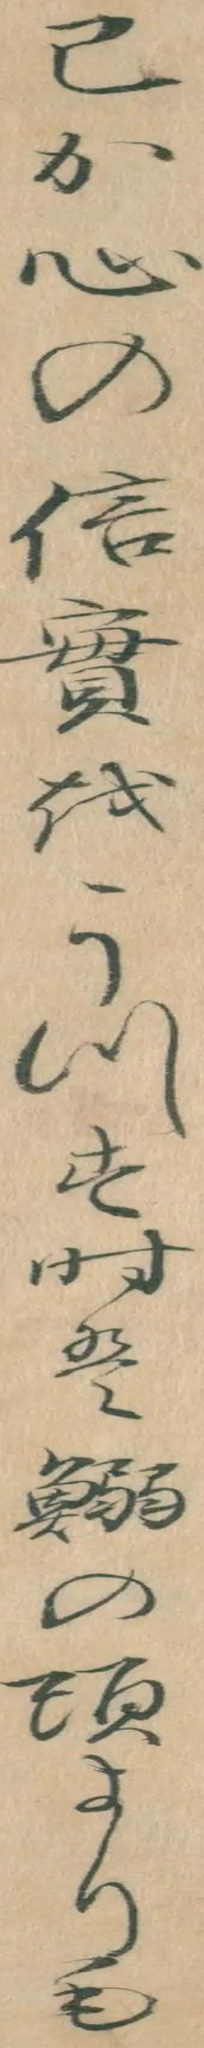己か心の信實をうつす時は鰯の頭よりも

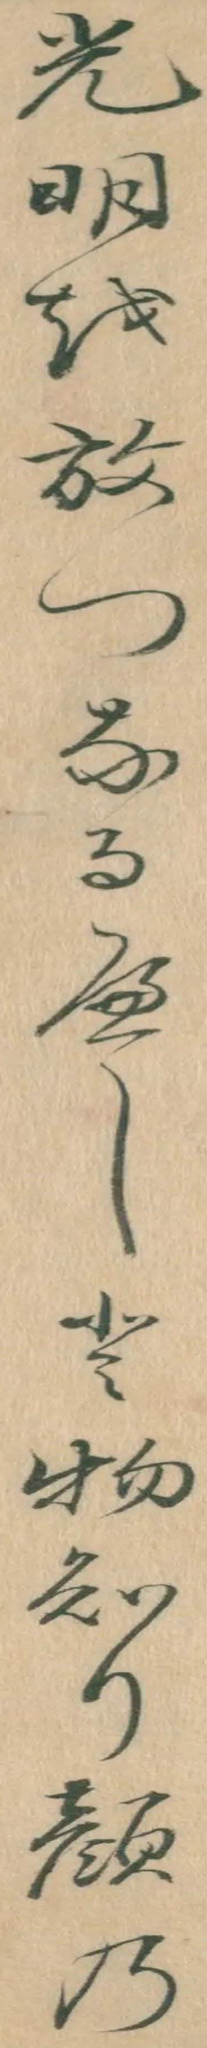光明を放つなるへしと物知り顔の
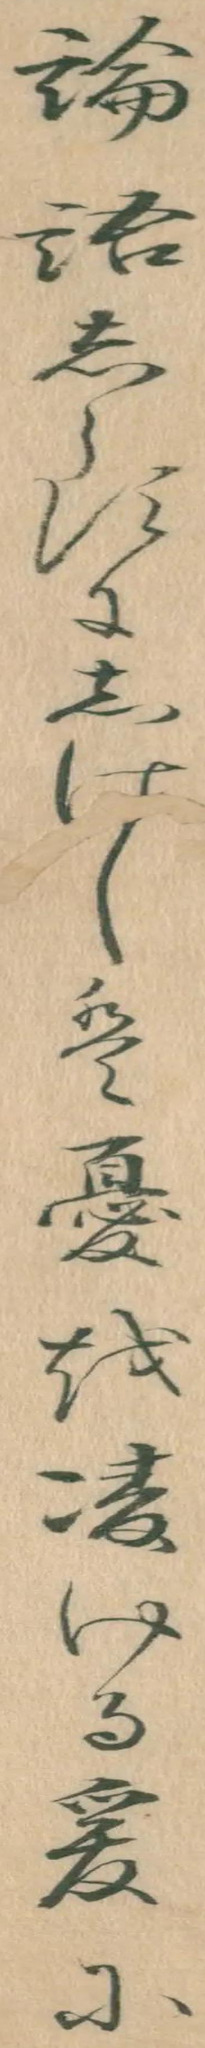論語しらすにしはしは憂を凌ける爰に
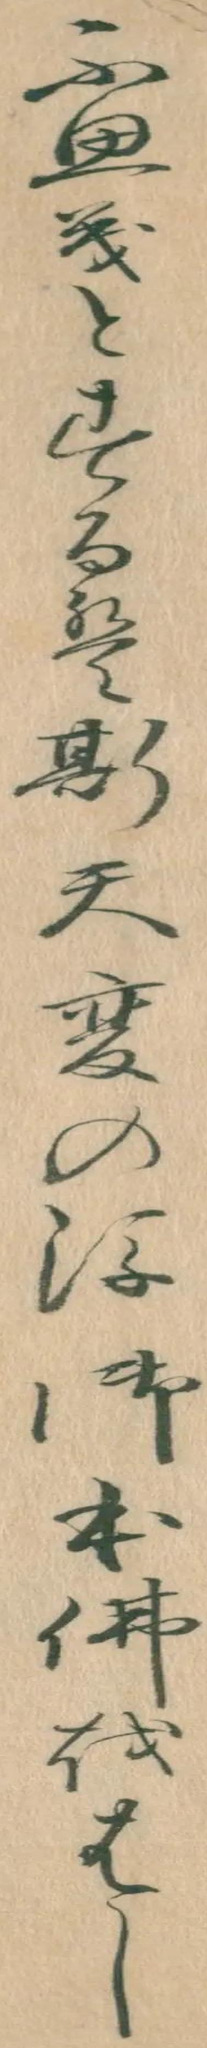ふしきとするは斯天変の後御本佛をはし
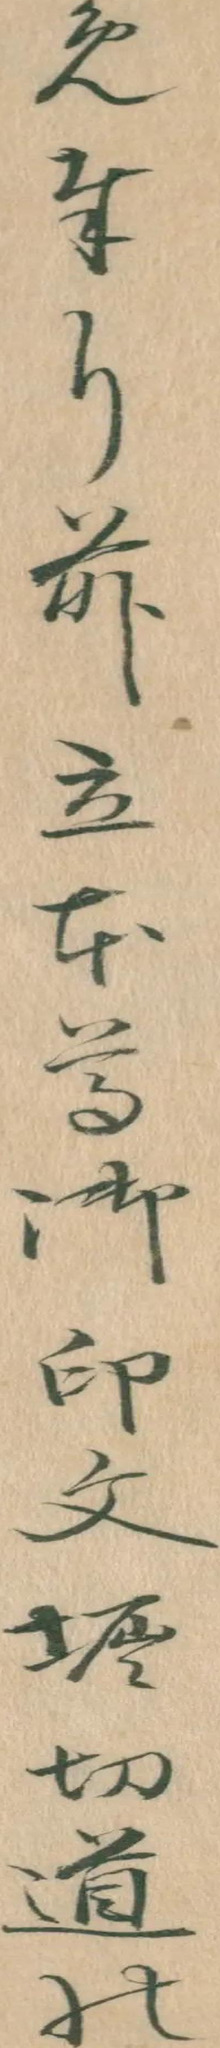め奉に前立本尊御印文堀切道の
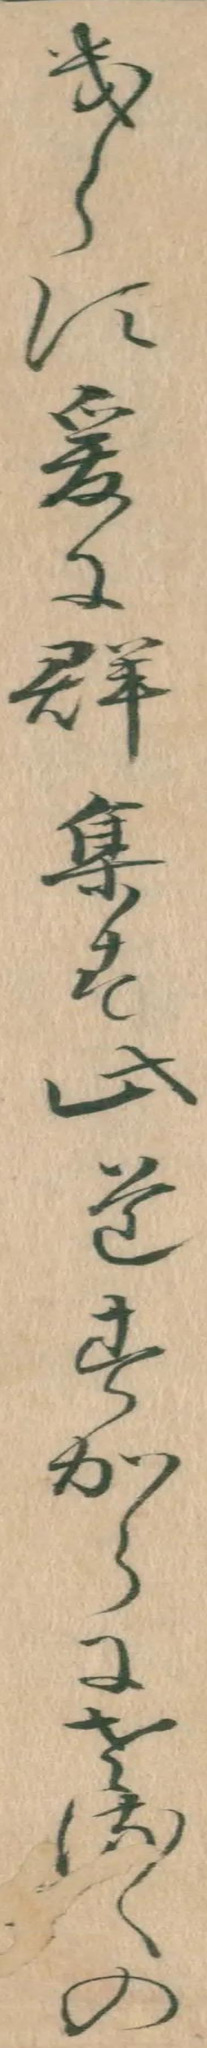きらす爰に群集す此道すからにさま〳〵の
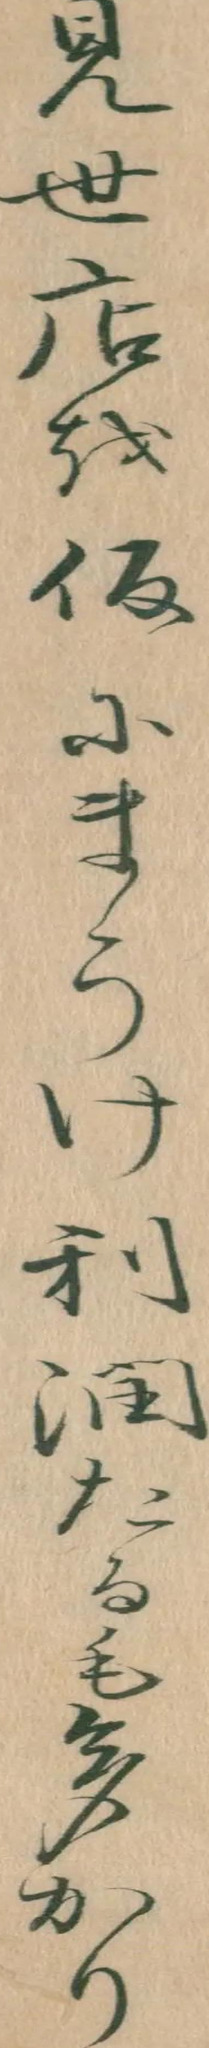見世店を仮にまうけ利潤たるも多かり
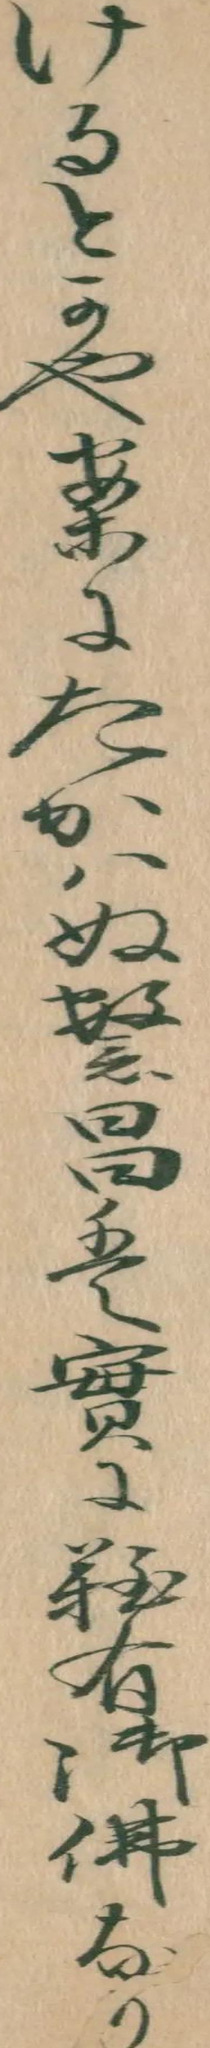けるとかや案にたかはぬ繁昌は實に難有御佛なり
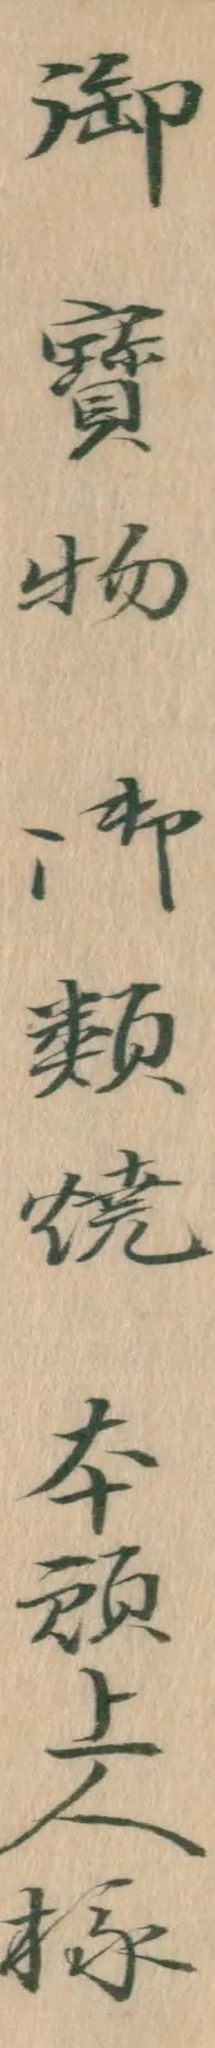御寶物御類焼本願上人様
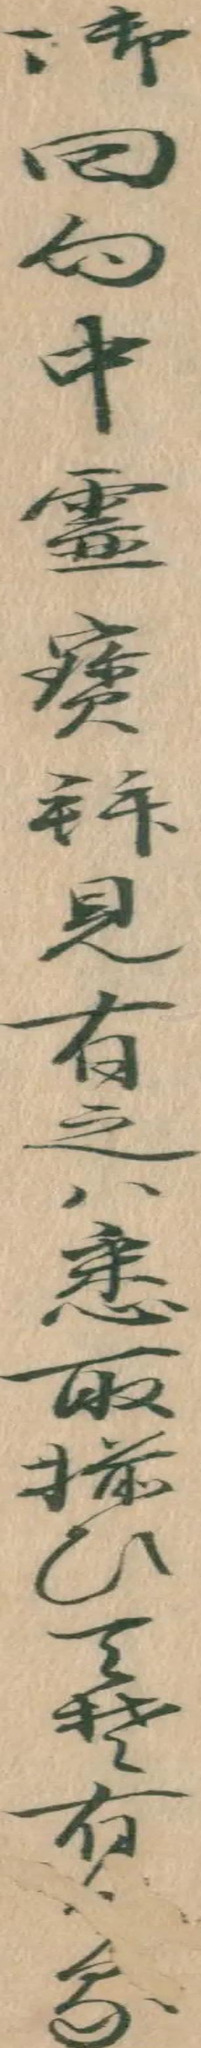御回向中霊寶拝見有之は悉取揃ひてそ有る
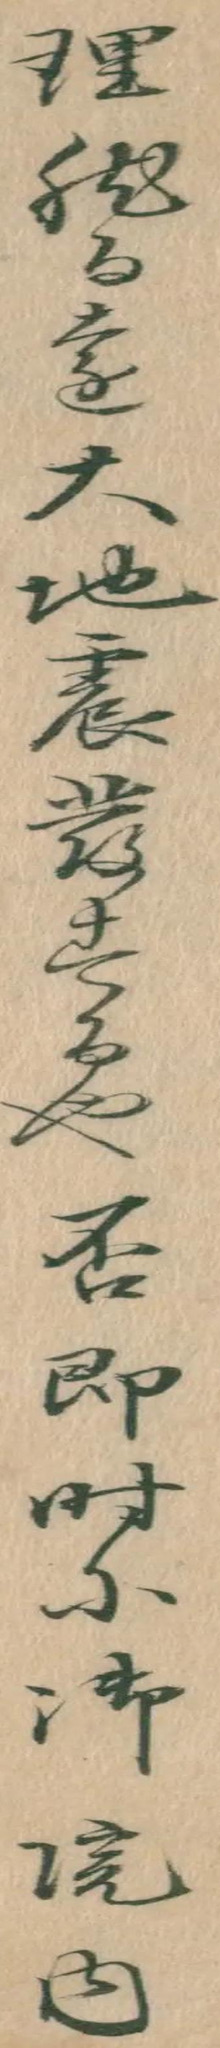理然るを大地震發するや否即時に御院内
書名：俗語之種. [7]
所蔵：国立国会図書館 National Diet Library, JAPAN
